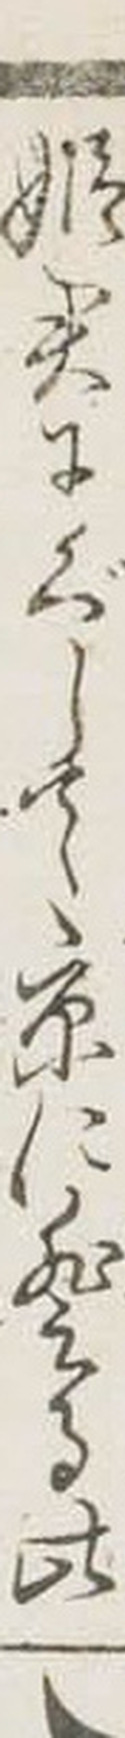姫君にぐして京に登る此
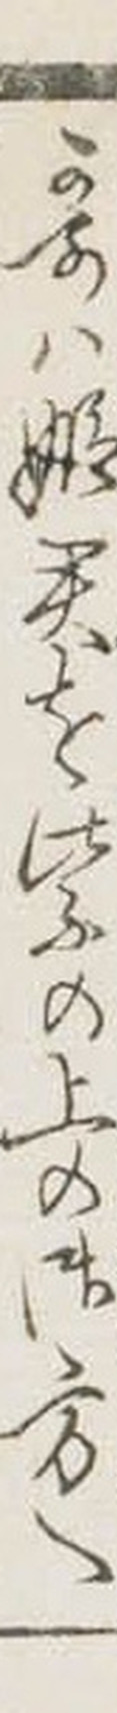哥は姫君を紫の上の御方へ
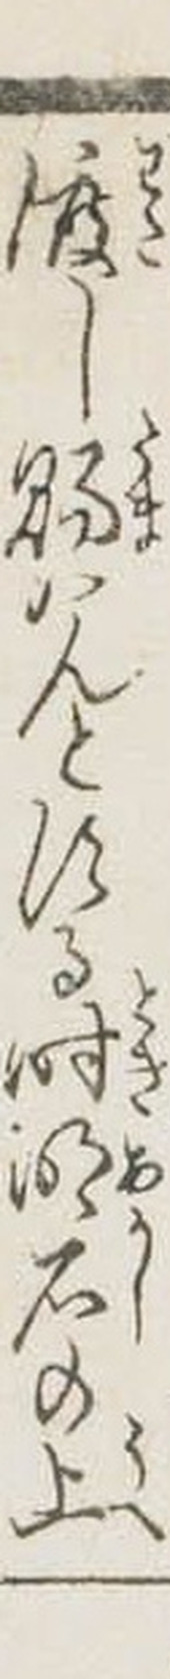渡し賜はんとする時明石の上
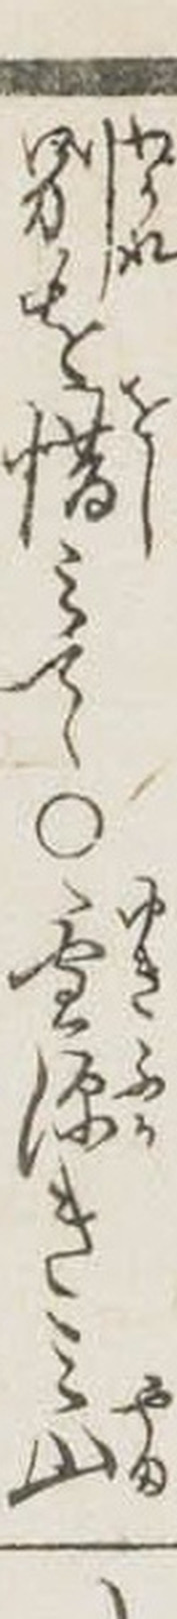別を惜みて○雪深きみ山
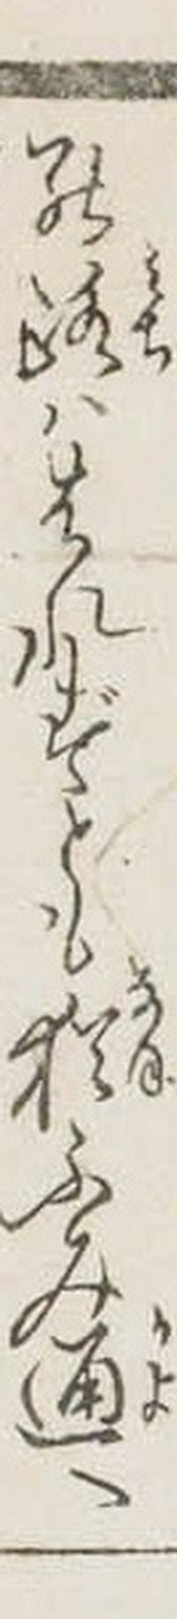の路ははれずとも猶ふみ通へ
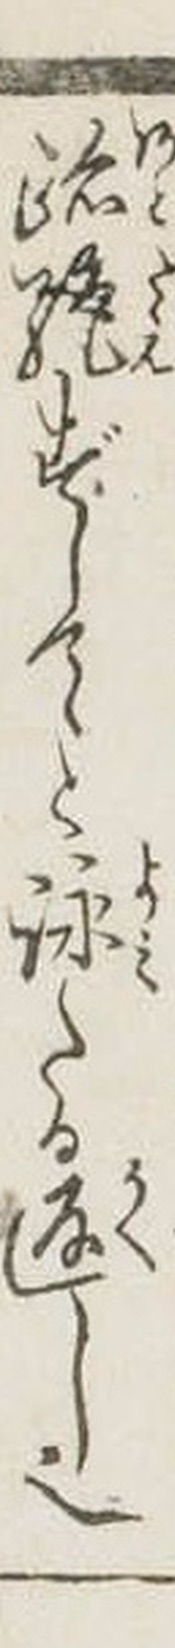跡絶ずしてと詠たる返し也
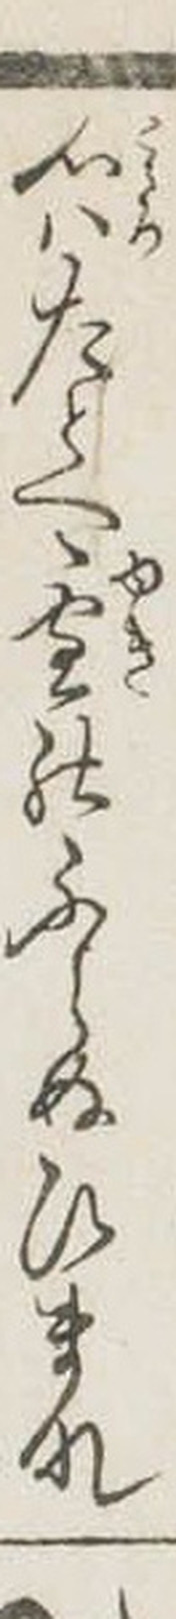心はたとへ雪のふらぬひまな
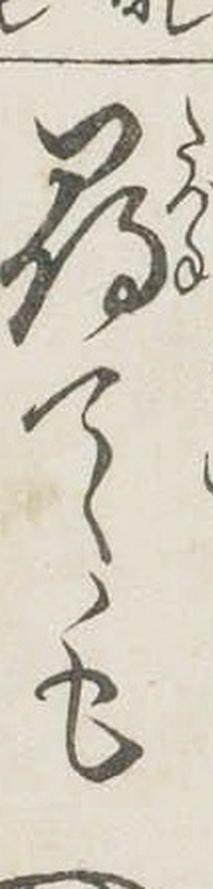尋ても
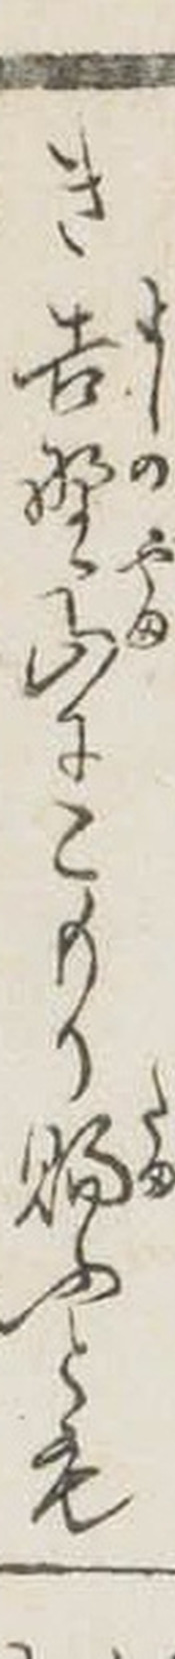き吉野山にこもり賜ふとも
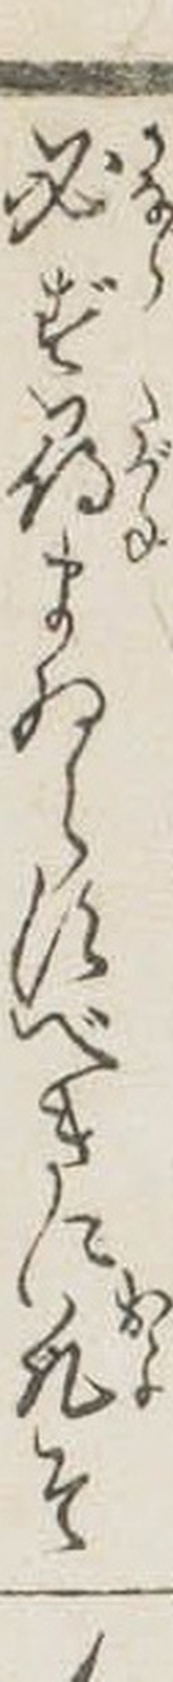必ず尋まゐらすべきに凡そ
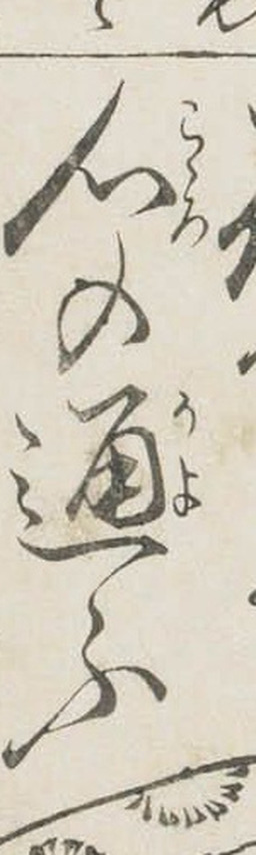心の通ふ
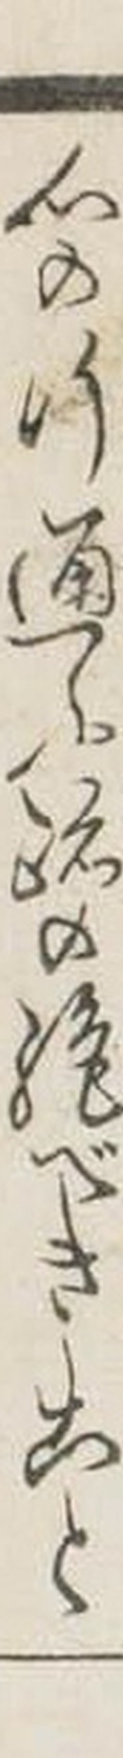心の行通ふ跡の絶べきこと
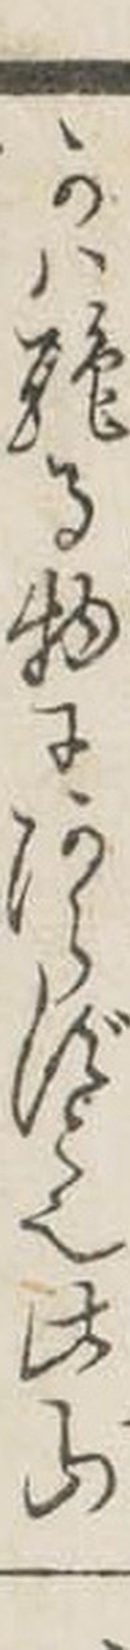かは絶る物にあらずと也此山
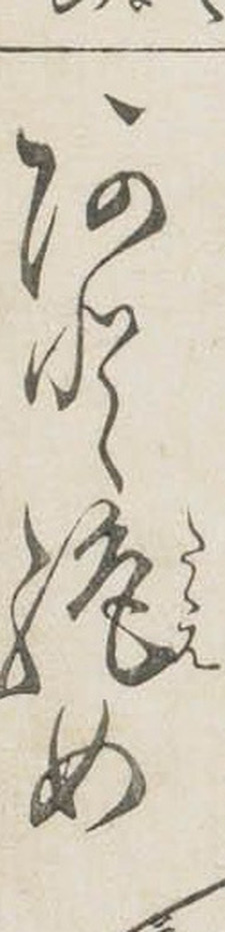あと絶め
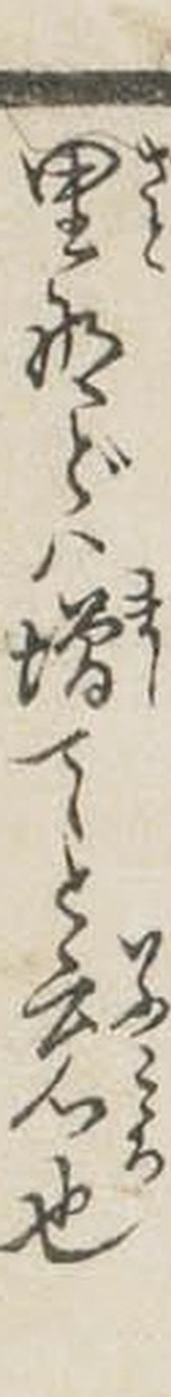里などは増てと云心也

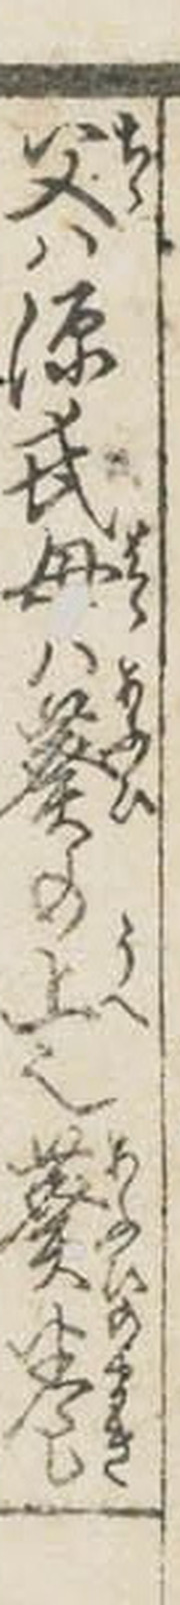父は源氏母は葵の上也葵巻
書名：源氏百人一首
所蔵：東京学芸大学教育コンテンツアーカイブ
